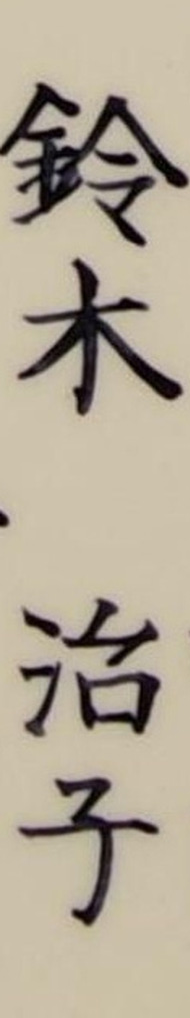鈴木治子
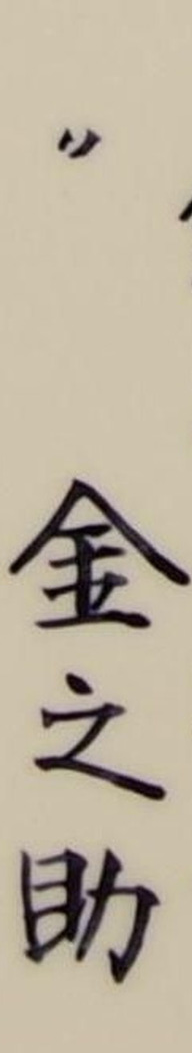金之助
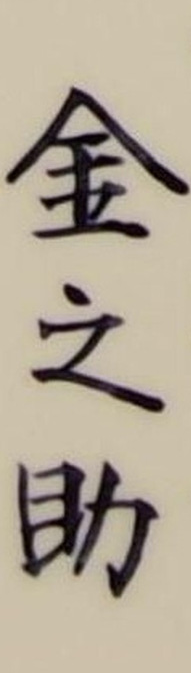金之助
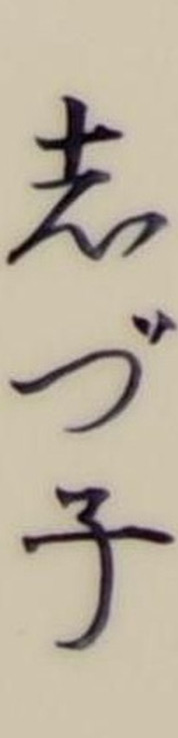しづ子
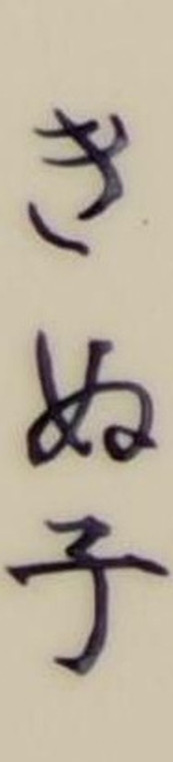きぬ子
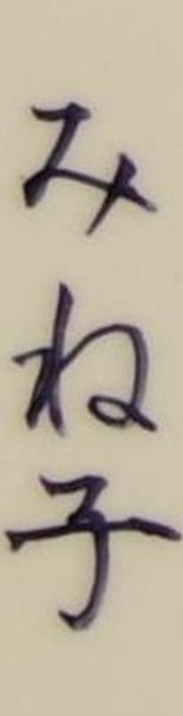みね子
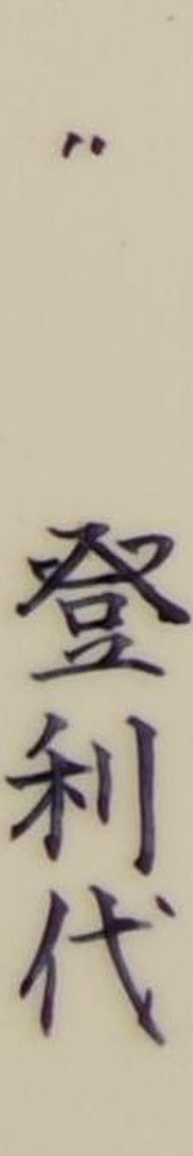登利代
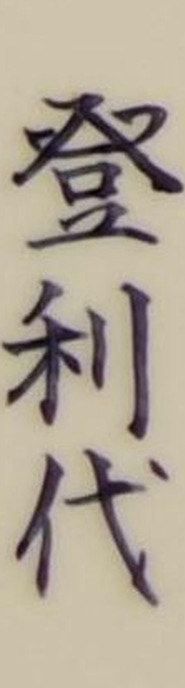登利代
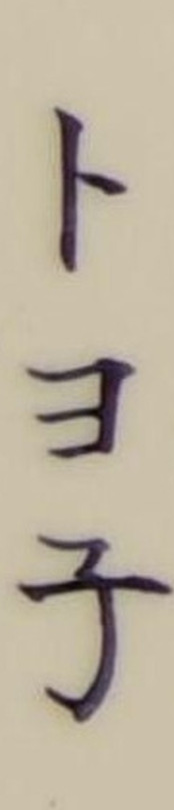トヨ子

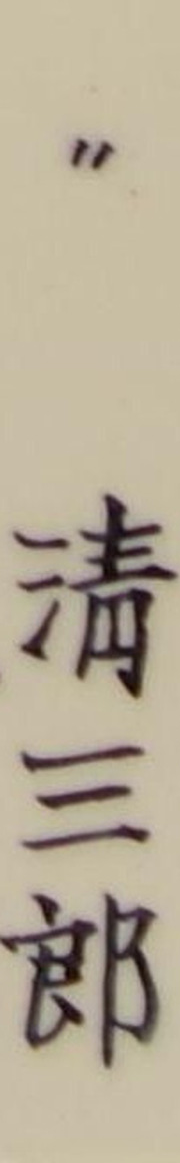清三郎
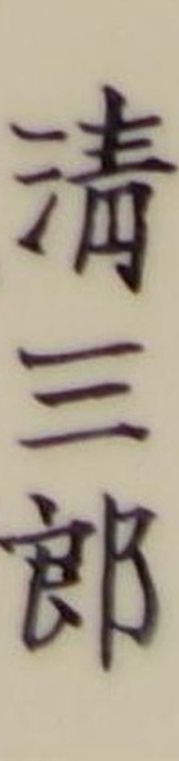清三郎
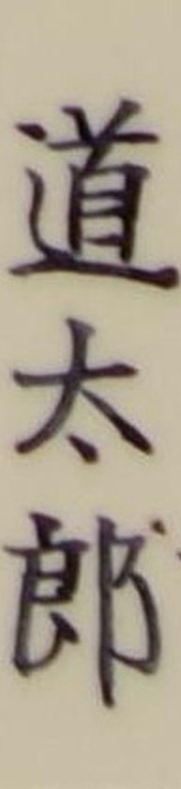道太郎
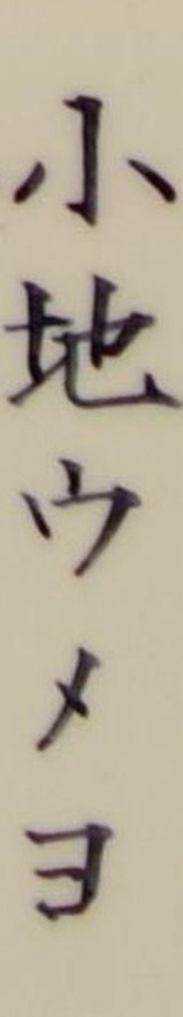小地ウメヨ
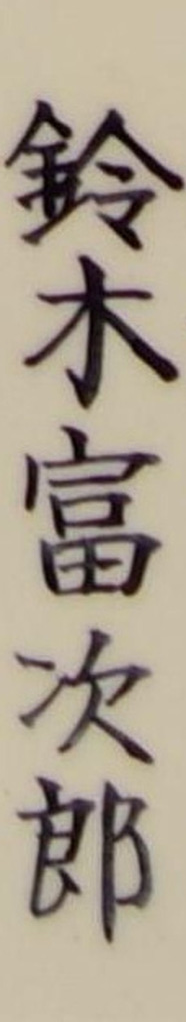鈴木富次郎
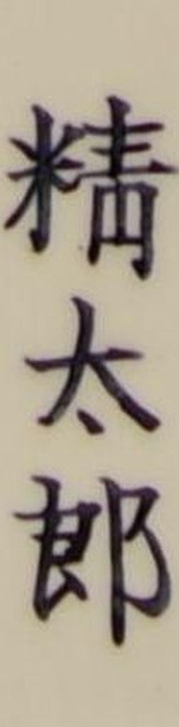精太郎
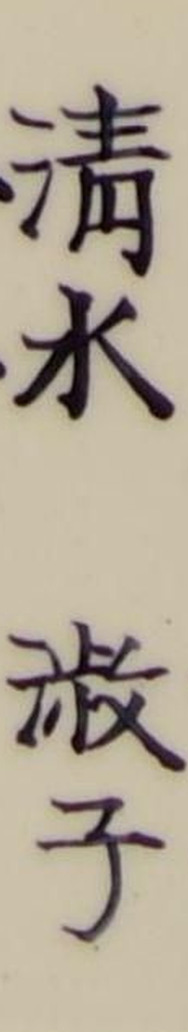清水淑子
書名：A~D
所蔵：koyasan kongobuji
